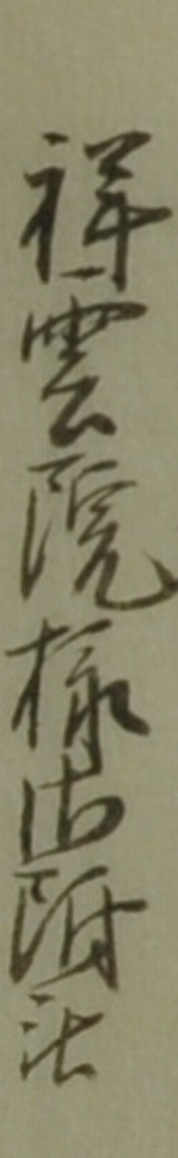祥雲院様御附無滞
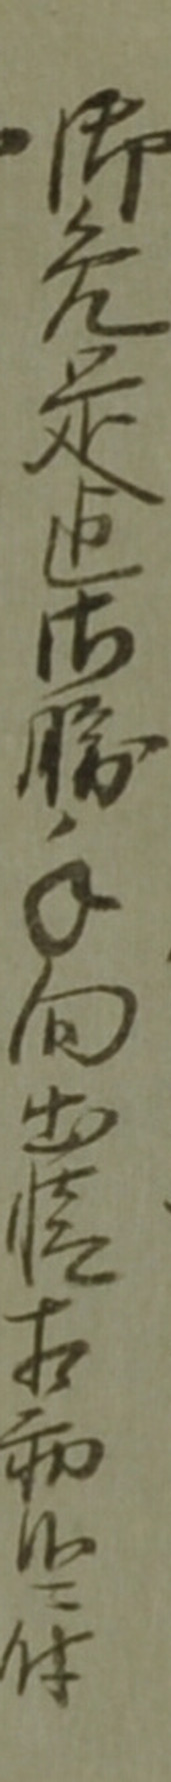御免是迄御勝手向出精相勤候ニ付
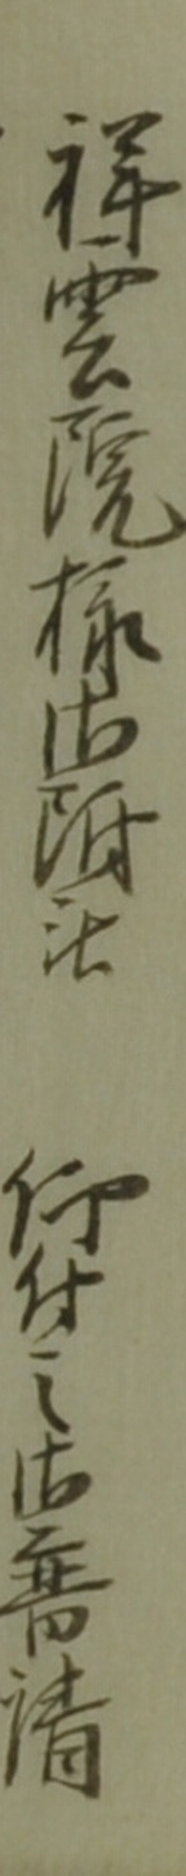祥雲院様御附被仰付之御普請
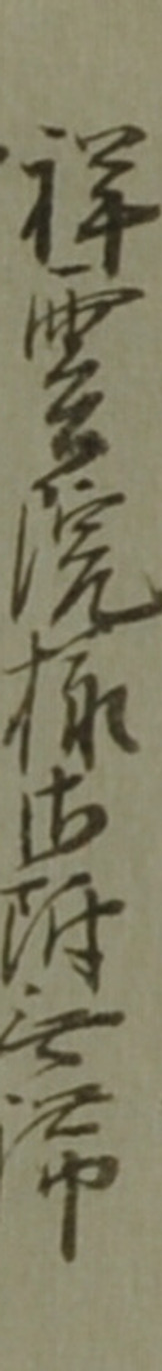祥雲院様御附無滞
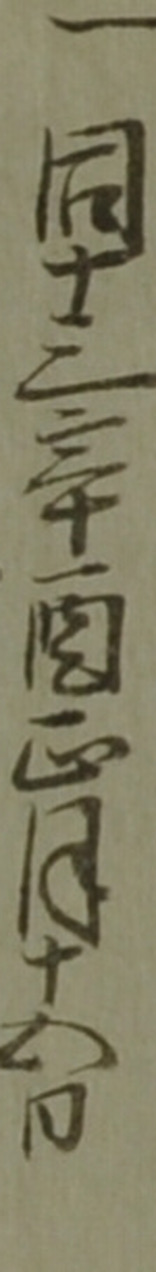一同十三辛酉正月十五日
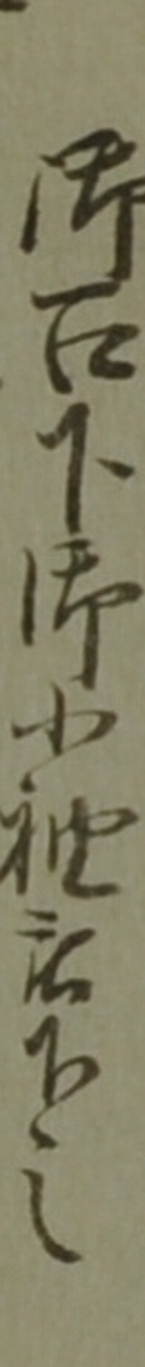御召下御小袖被下之
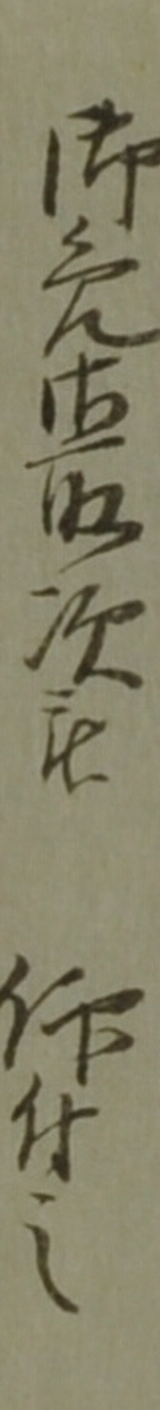御免御取次被仰付之
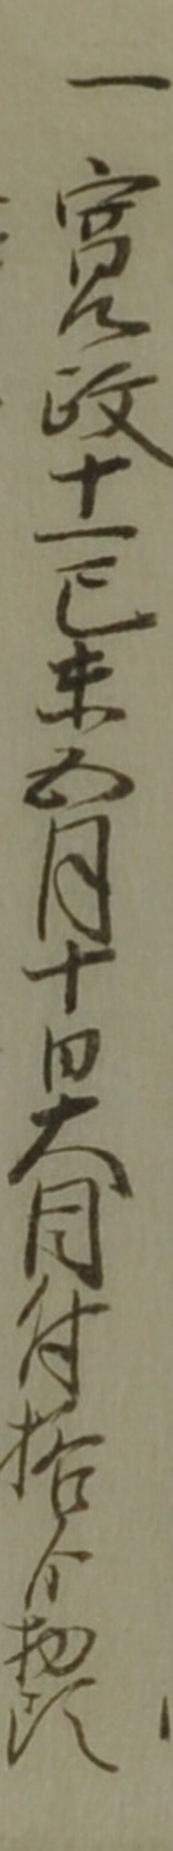一寛政十一己未五月十日大目付格ゟ物頭
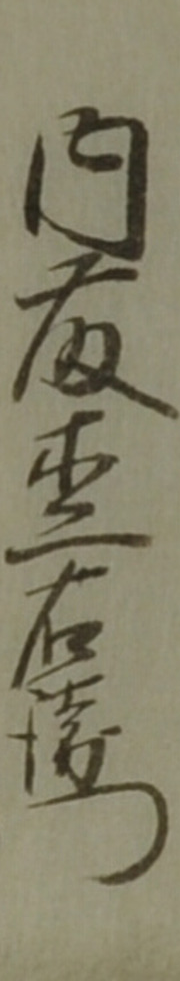内藤杢右衛門
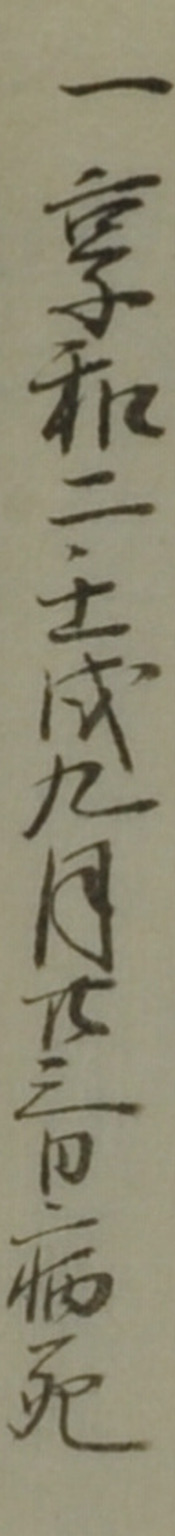一享和二壬戌九月廿三日病死
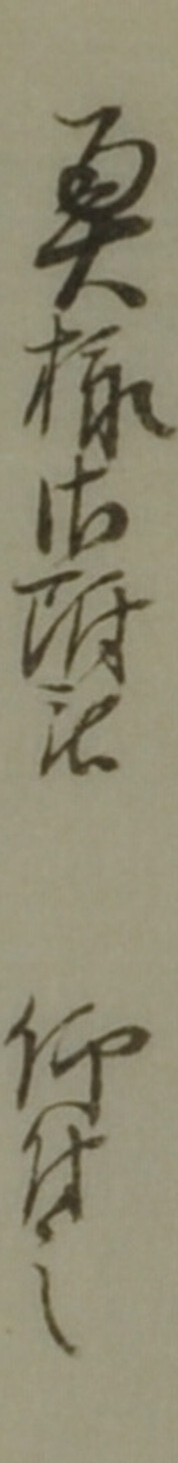奥様御附被仰付之
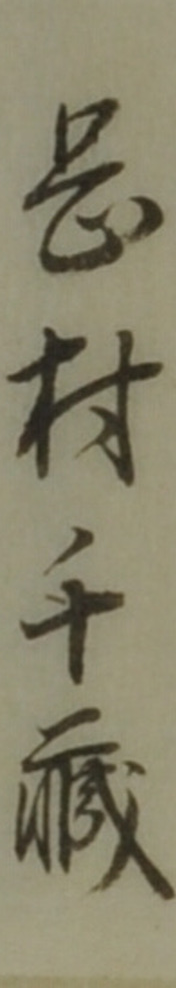岡村千蔵
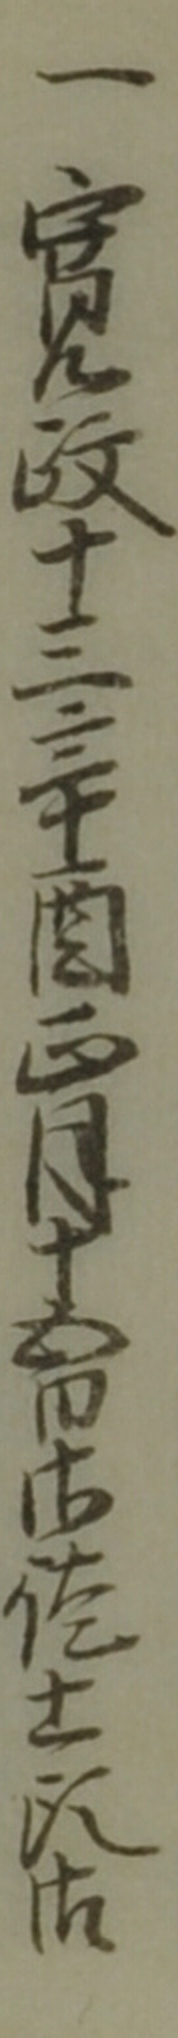一寛政十三辛酉正月十五日御徒士頭御
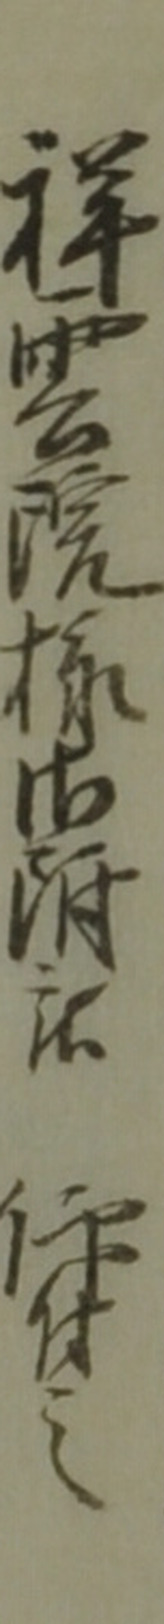祥雲院様御附被仰付之
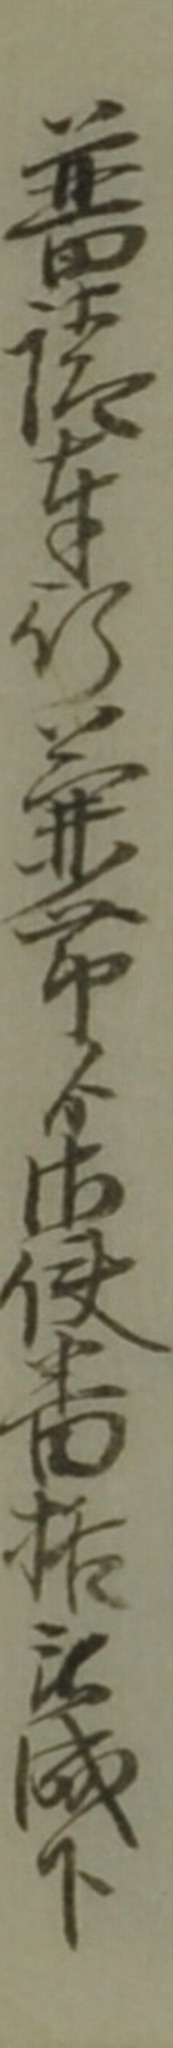普請奉行兼帯ゟ御使番格被成下
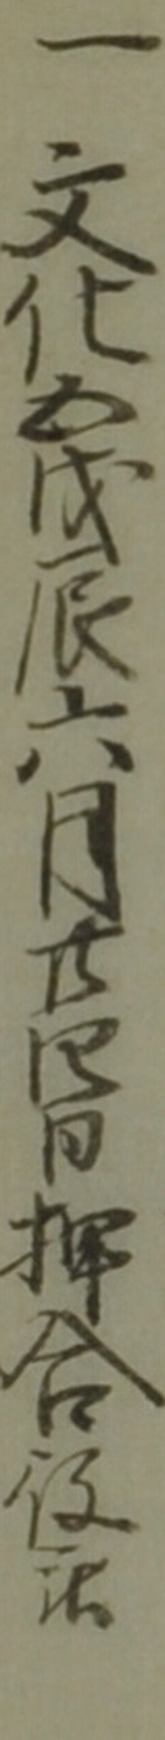一文化五戊辰六月廿四日押合役被
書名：諸御役代々録（六）
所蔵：伊那市立高遠町図書館・合同会社AMANE
